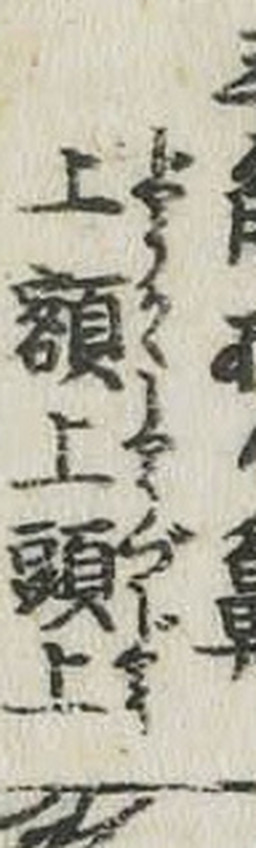上額上頭上
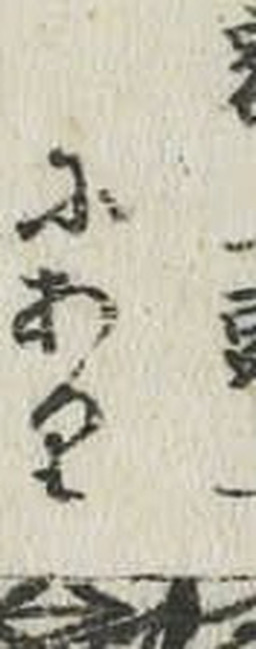にあり
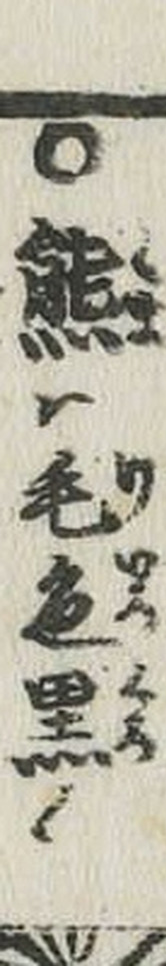○熊は毛色黒く
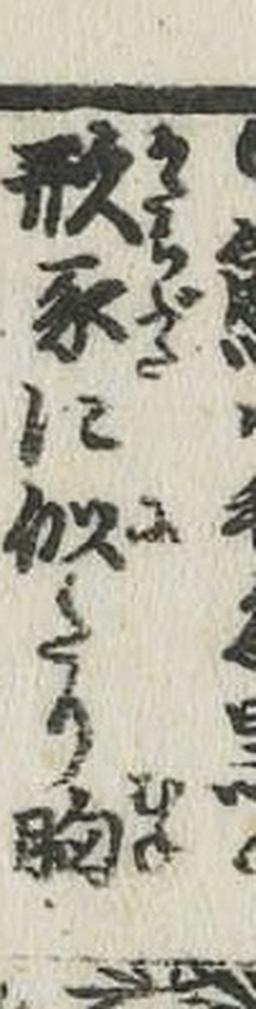形豕に似たり胸
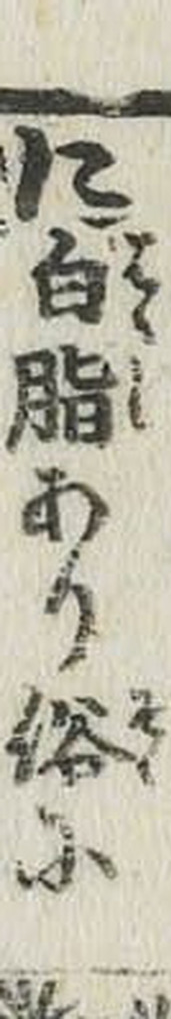に白脂あり俗に
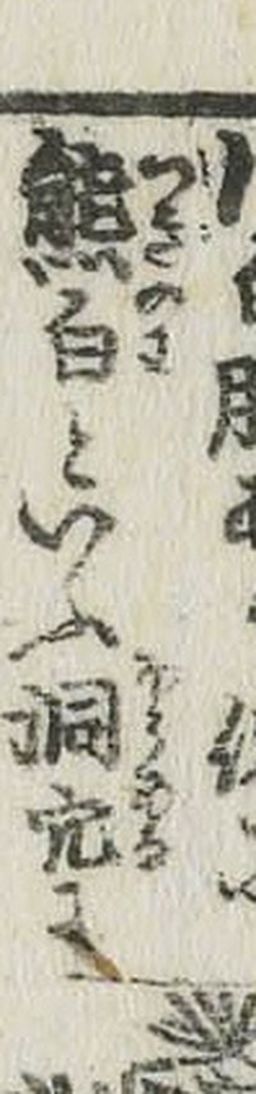熊白といふ洞穴に
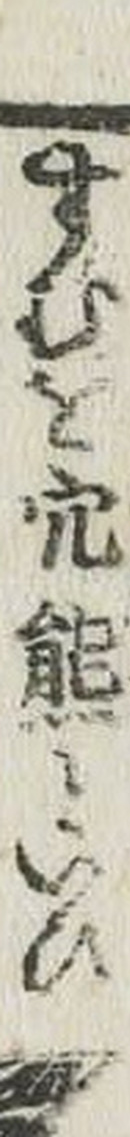すむを穴熊といひ
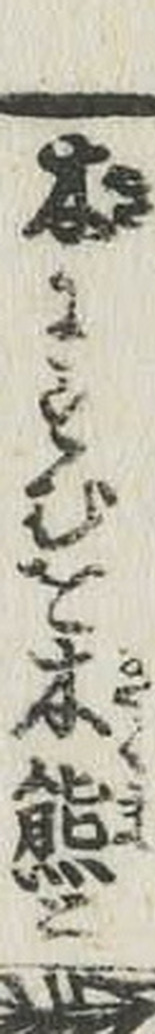木にすむを木熊と
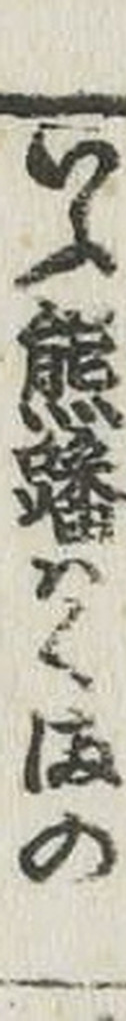いふ熊蹯はくまの
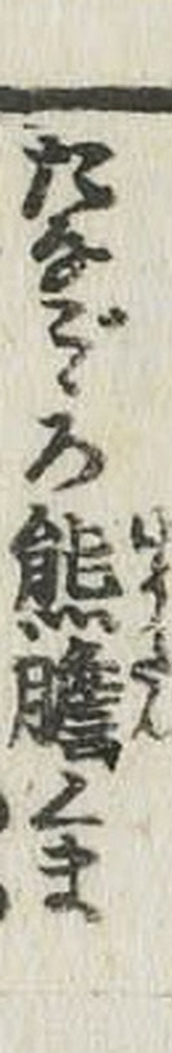たなごゝろ熊胆はくま
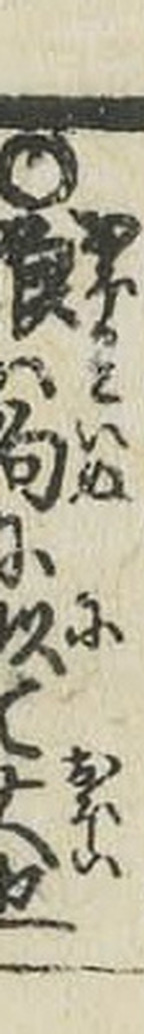○狼は狗に似て大也
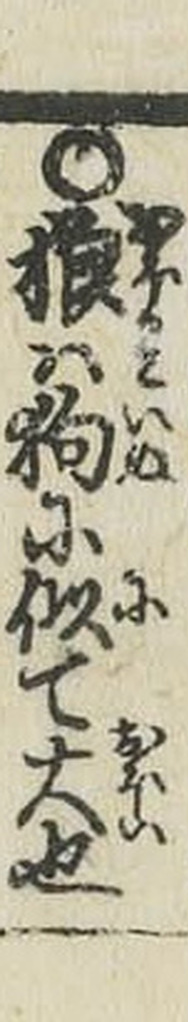○狼は狗に似て大也
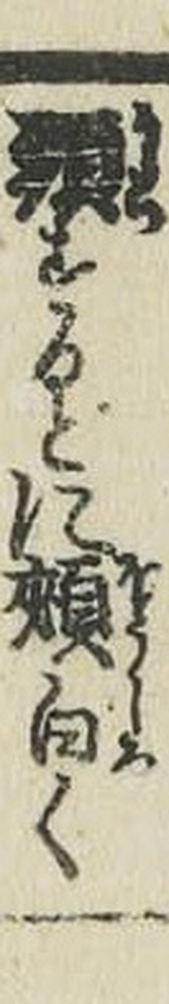頭するどき頬白く
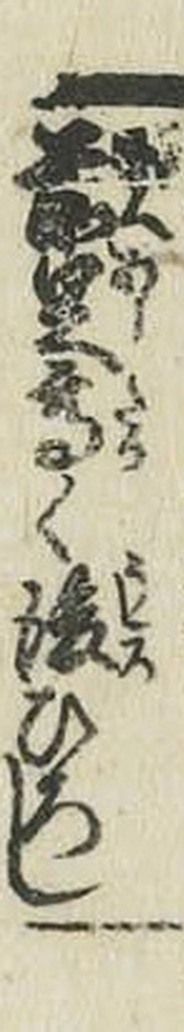前足高く後ひろし
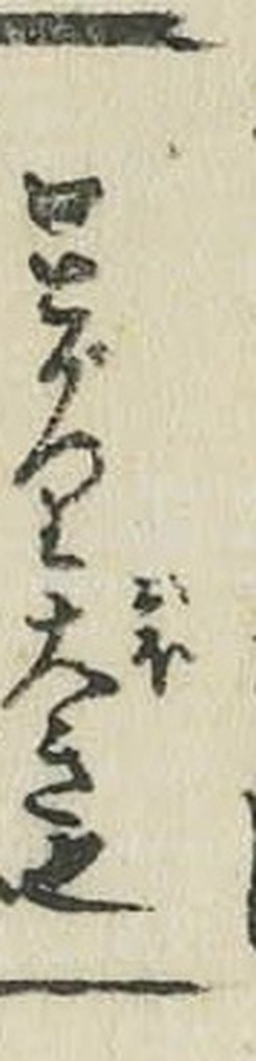口とがり大き也
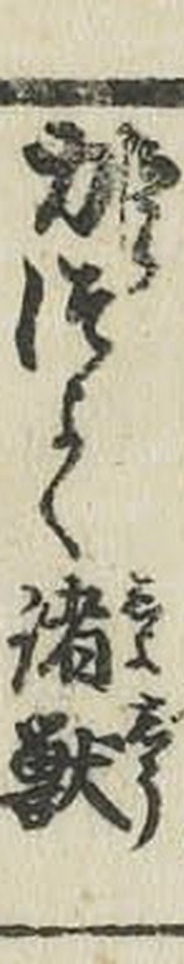力つよく諸獣
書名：増補頭書訓蒙図彙大成 10巻 6:巻之12-13
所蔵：東京学芸大学教育コンテンツアーカイブ
